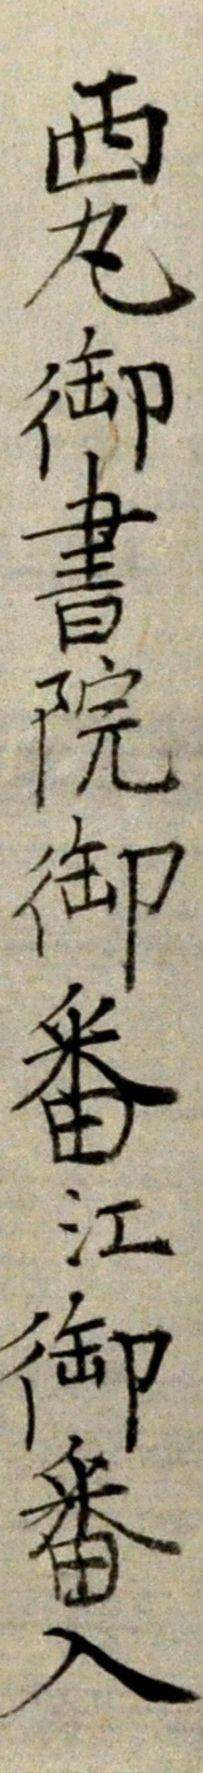西丸御書院御番江御番入
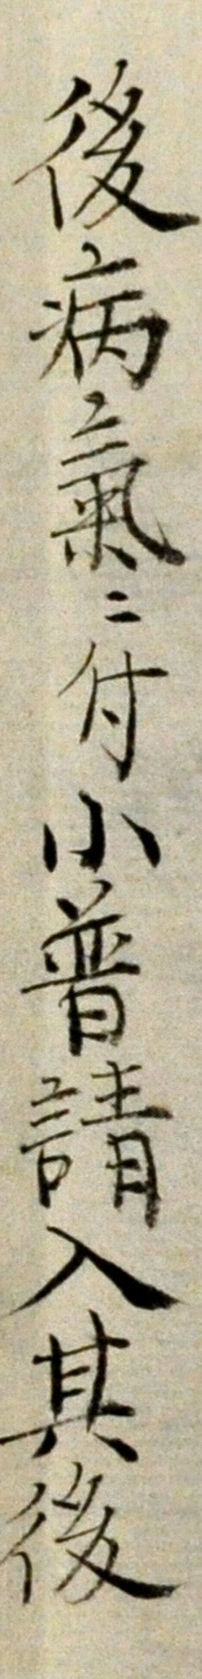後病気ニ付小普請入其後
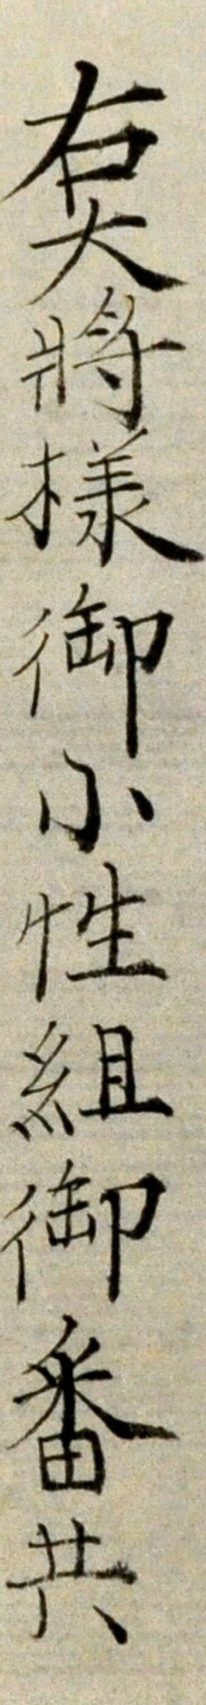右大将様御小性組御番共
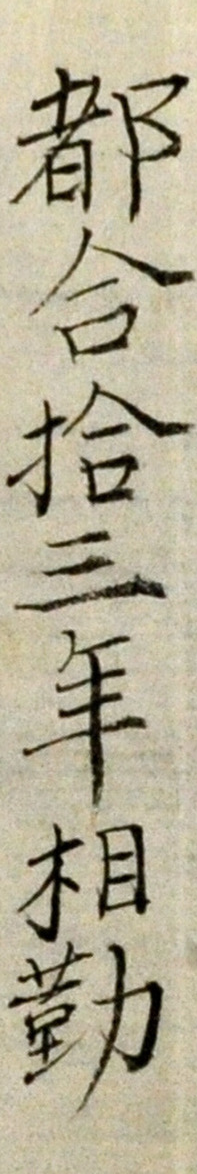都合拾三年相勤
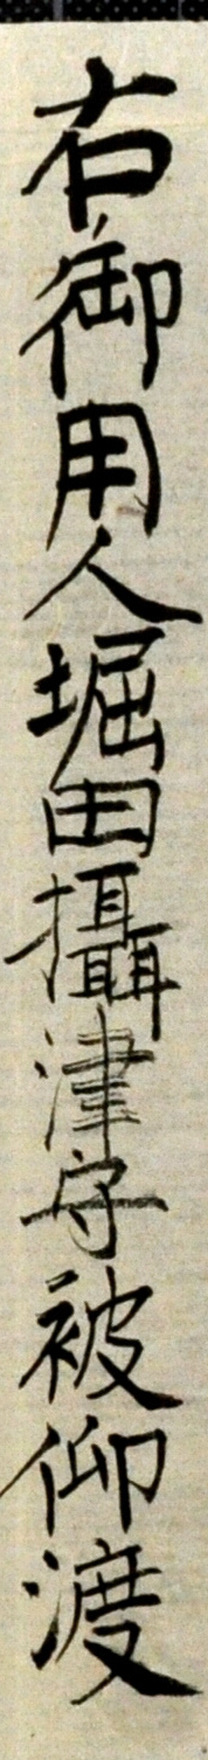右御用人堀田攝津守被仰渡
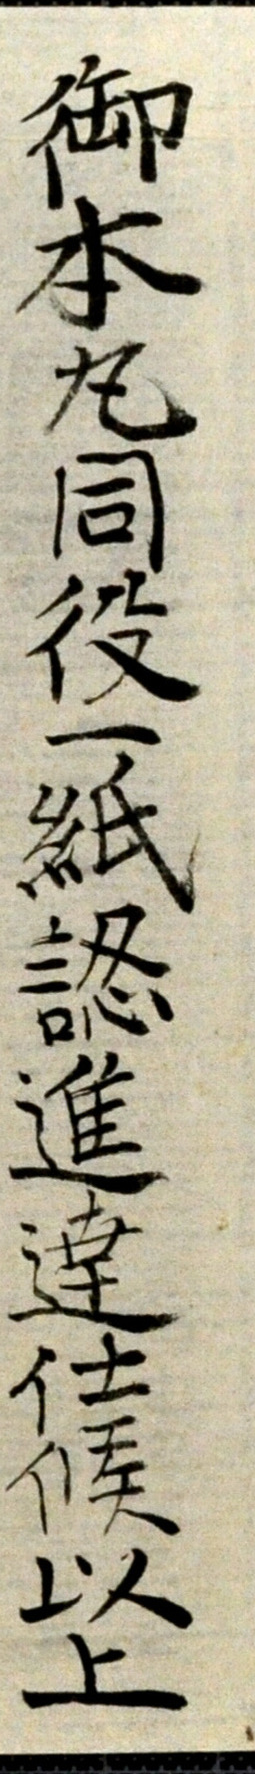御本丸同役一紙認進達仕候以上

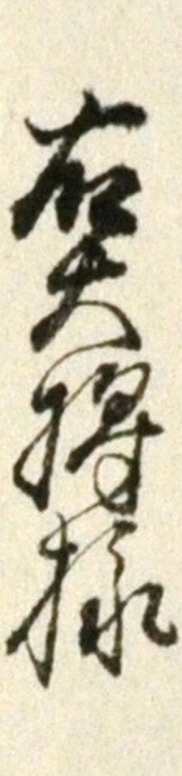右大将様
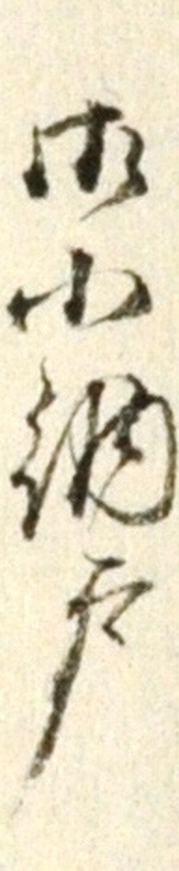御小納戸
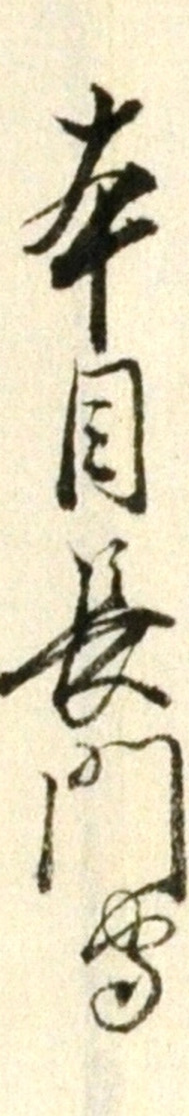本目長門守
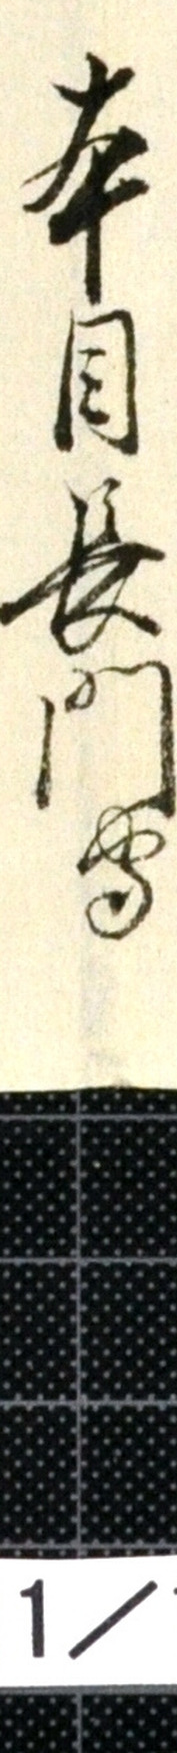本目長門守
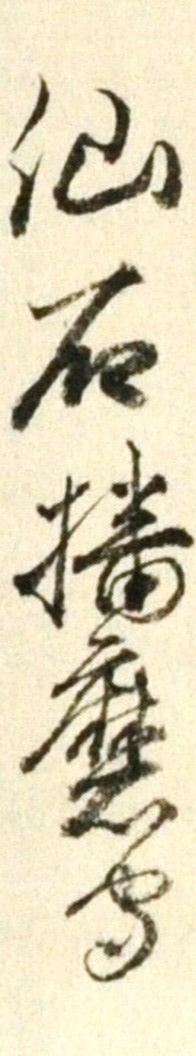仙石播磨守
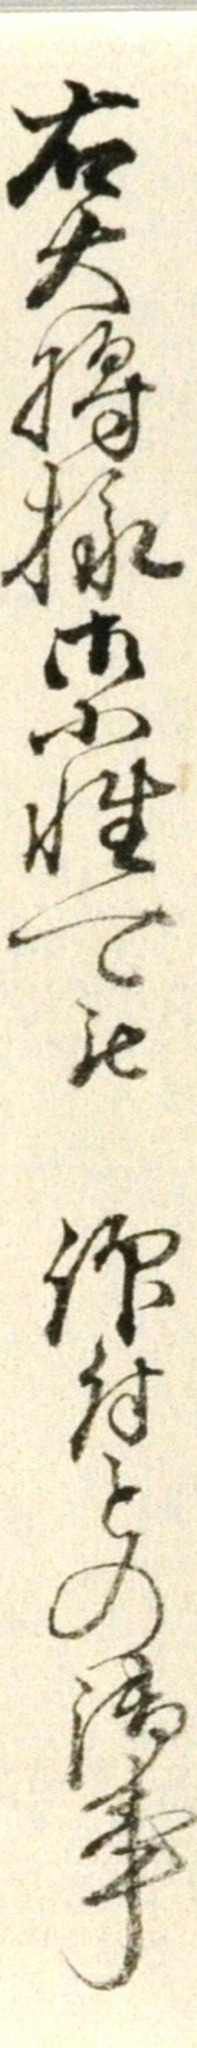右大将様御小性可被仰付との御事
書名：若年寄御役中御調書付
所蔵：伊那市立高遠町図書館・合同会社AMANE
